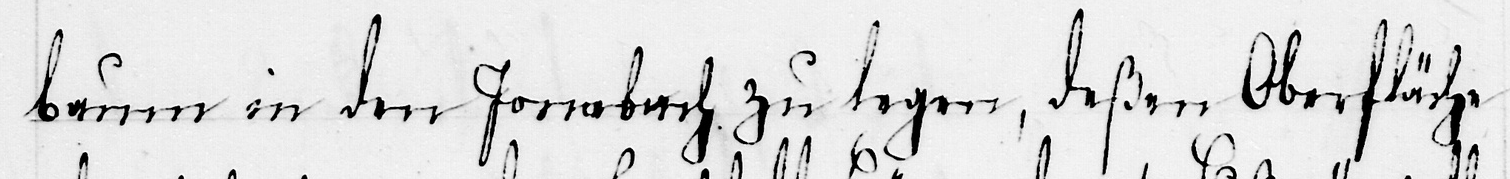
baum in den Jonabach zu legen, deßen Oberfläche
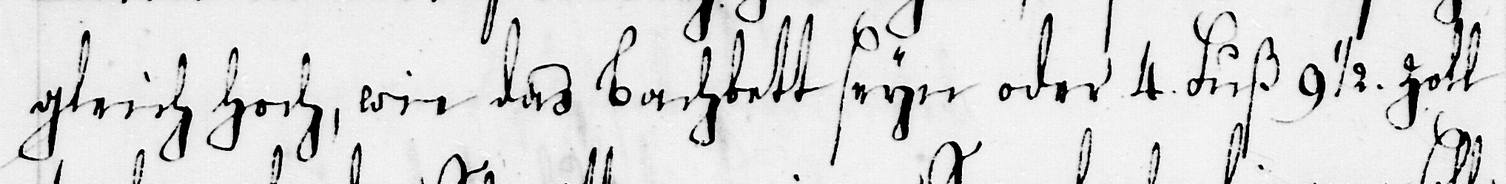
gleich hoch, wie das Bachbett seyn oder 4. Fuß 9 1/2. Zoll
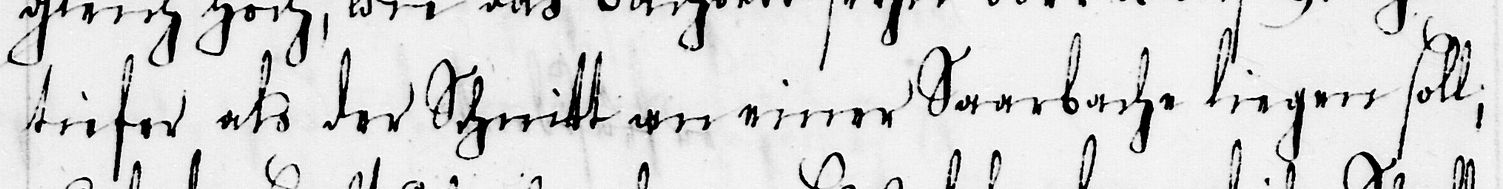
tiefer als der Schnitt an einer Saarbache liegen soll;
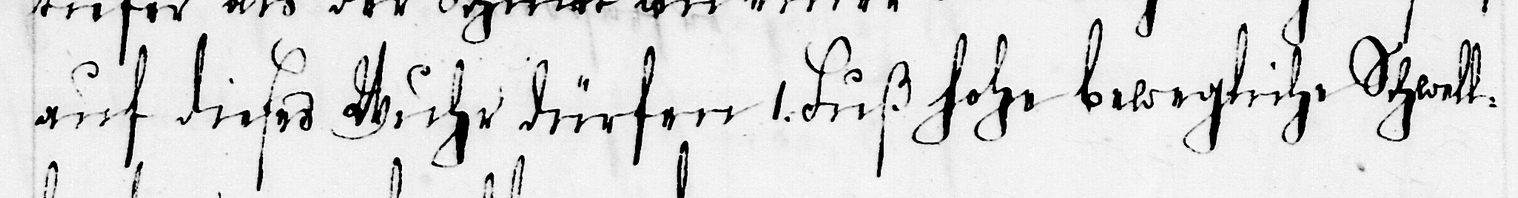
auf dieses Wuhr dürfen 1. Fuß hohe bewegliche Schwel¬
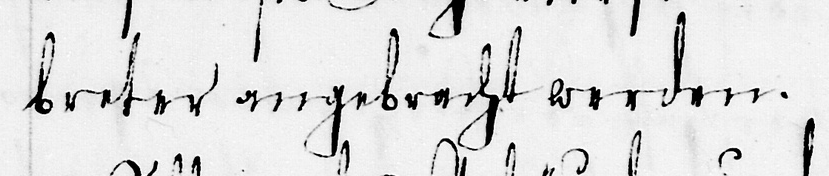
lbreter angebracht werden.
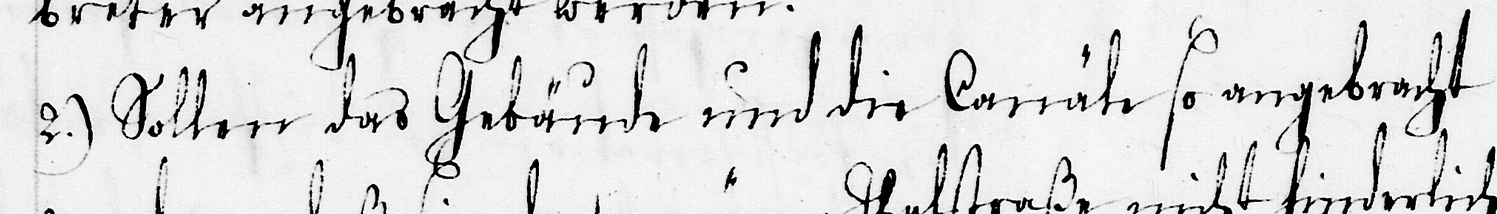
2.) Sollen das Gebäude und die Canäle so angebracht
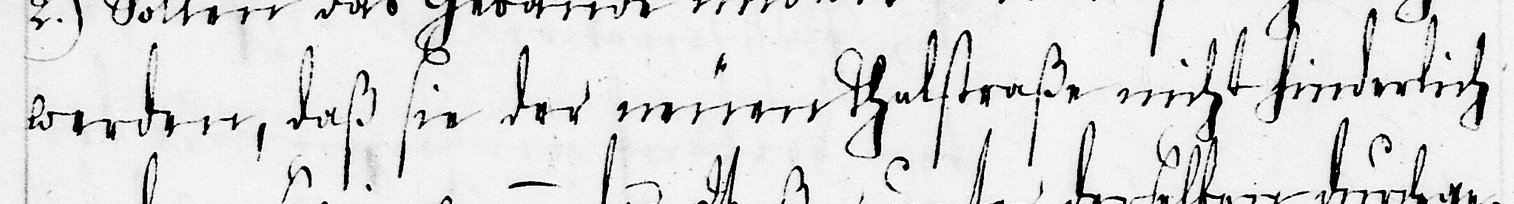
werden, daß sie der neuen Thalstraße nicht hinderlich
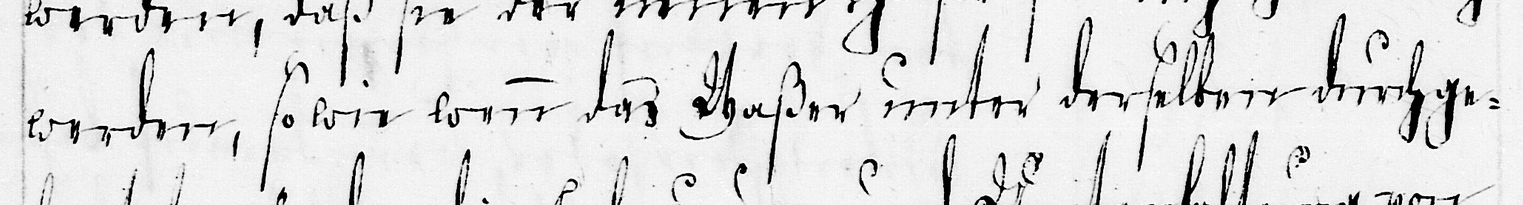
werden, so wie wenn das Waßer unter derselben durchge¬
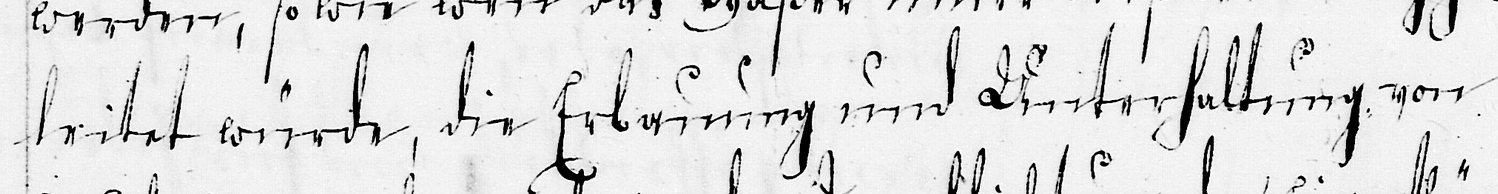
leitet würde, die Erbauung und Unterhaltung von
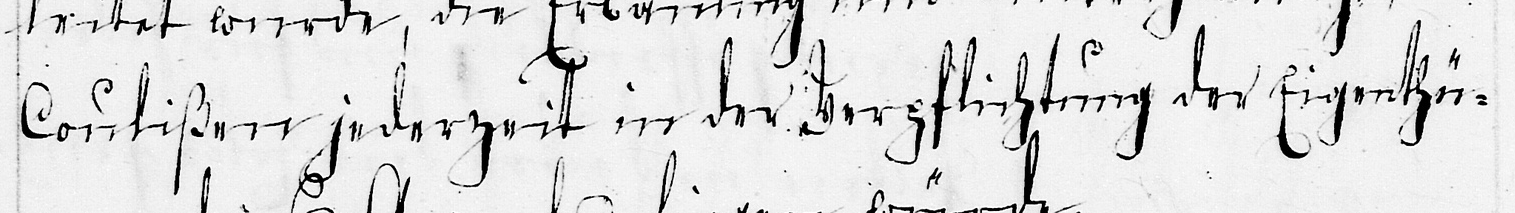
Coulißen jederzeit in der Verpflichtung der Eigenthü¬
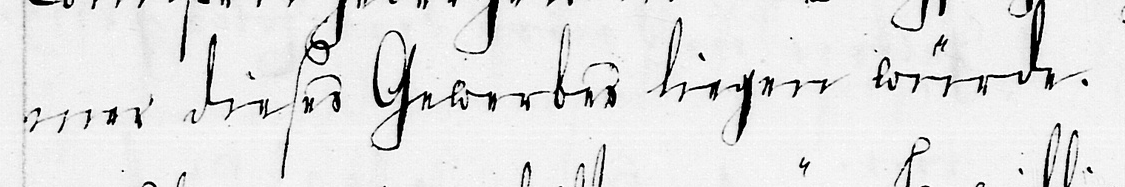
mer dieses Gewerbes liegen würde.
